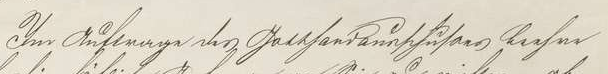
Im Auftrage des Gotthardausschusses beehre
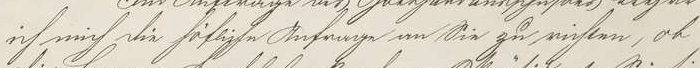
ich mich die höfliche Anfrage an Sie zu richten, ob
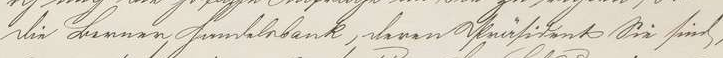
die Berner Handelsbank, deren Präsident Sie sind,
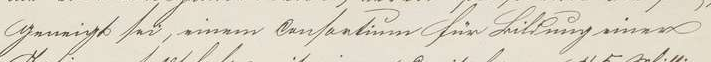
geneigt sei, einem Consortium für Bildung einer
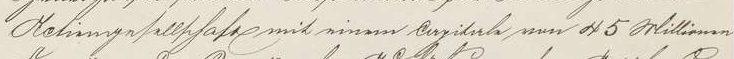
Actiengesellschaft mit einem Capitale von 45 Millionen
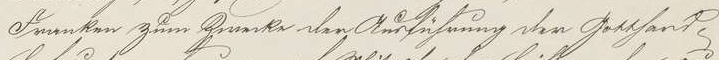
Franken zum Zwecke der Ausführung der Gotthard -
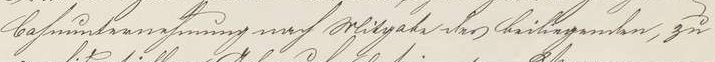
bahnunternehmung nach Mitgabe des beiliegenden, zu
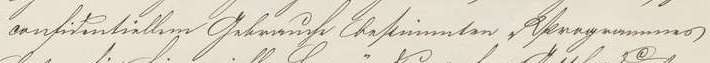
confidentiellem Gebrauche bestimmten «Programmes
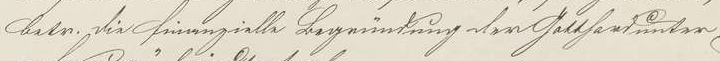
betr. die finanzielle Begründung der Gotthardunter-
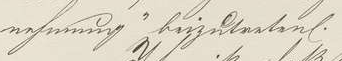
nehmung» beizutreten.
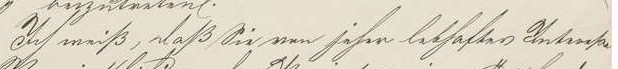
Ich weiß, daß Sie von jeher lebhaftes Interesse
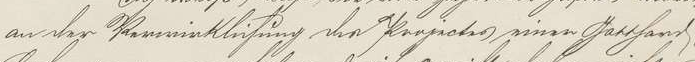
an der Verwirklichung des Projectes einer Gotthard -
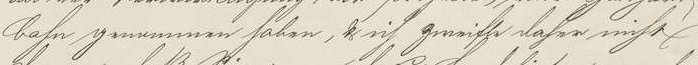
bahn genommen haben, & ich zweifle daher nicht
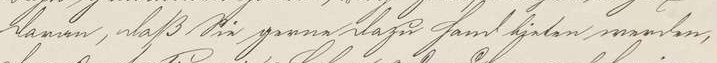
daran, daß Sie gerne dazu Hand bieten werden,
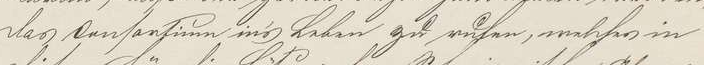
das Consortium in's Leben zu rufen, welches in
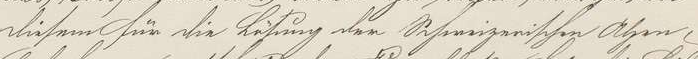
diesem für die Lösung der Schweizerischen Alpen -
